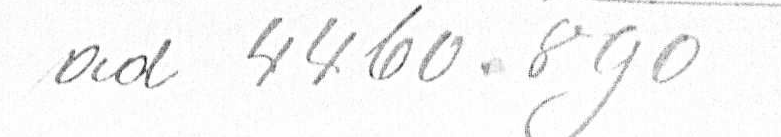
ad 4460. 890
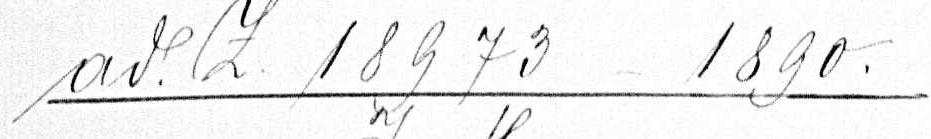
ad. Z. 18973 - 1890.
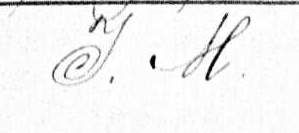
I. M.
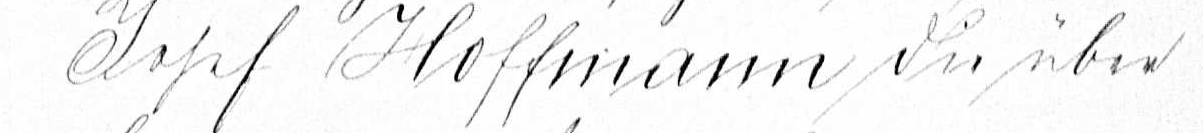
Josef Hoffmann die über
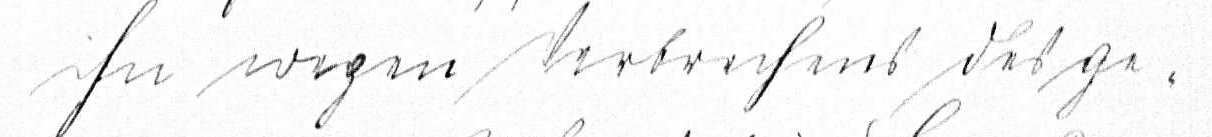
ihn wegen Verbrechens des ge¬
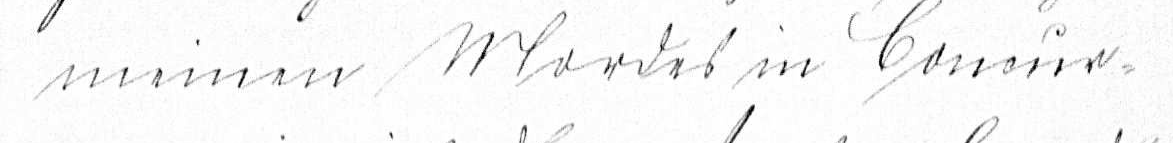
meinen Mordes in Concur¬
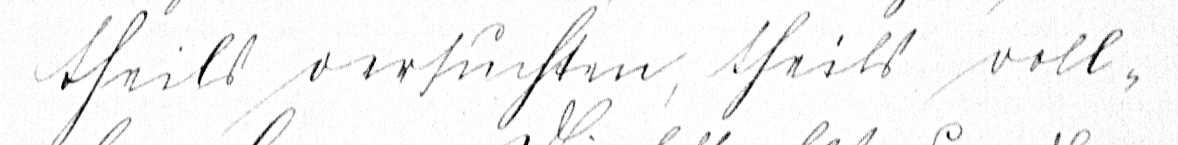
theils versuchten, theils voll¬
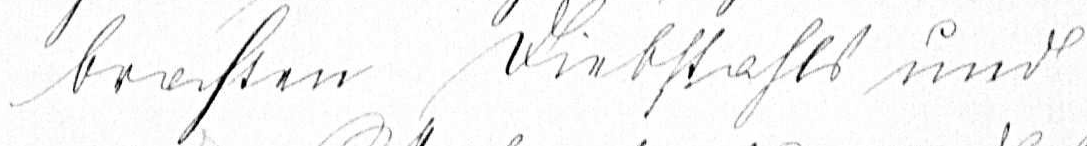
brachten. Diebstahls und
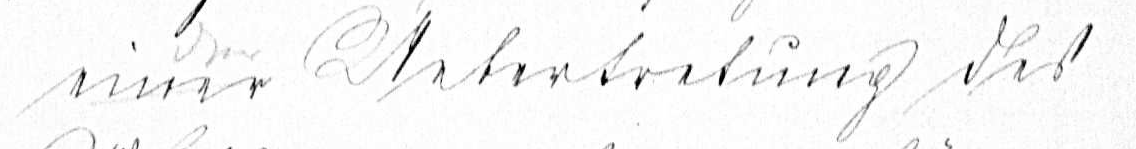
einer Untertretung des
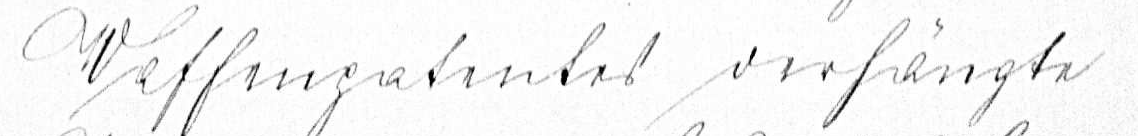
Waffenpatentes verhängte
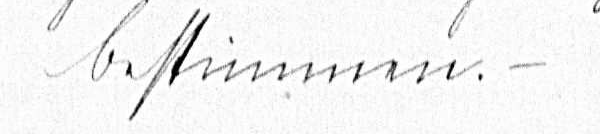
bestimmen.-
